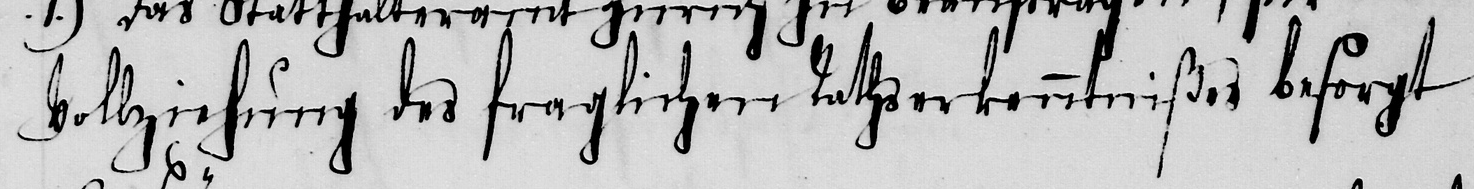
Vollziehung des fraglichen Rathserkenntnißes besorgt
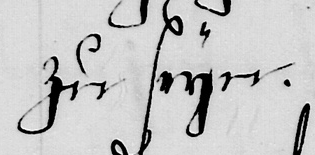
zu seyn.
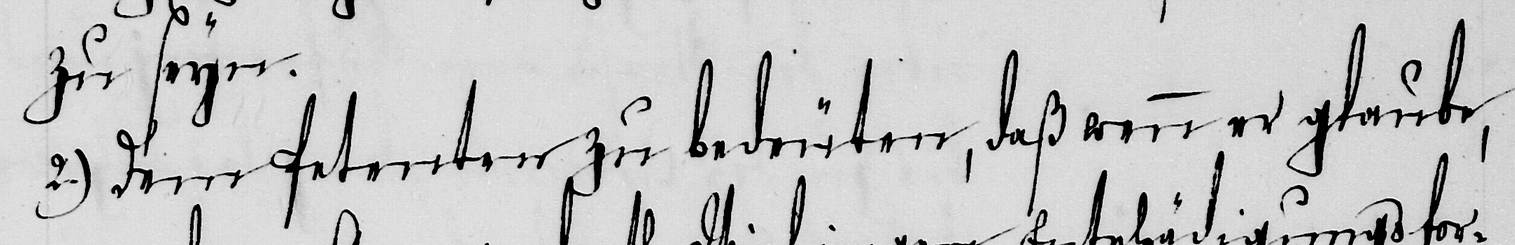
2.) Dem Petenten zu bedeuten, daß wenn er glaube,
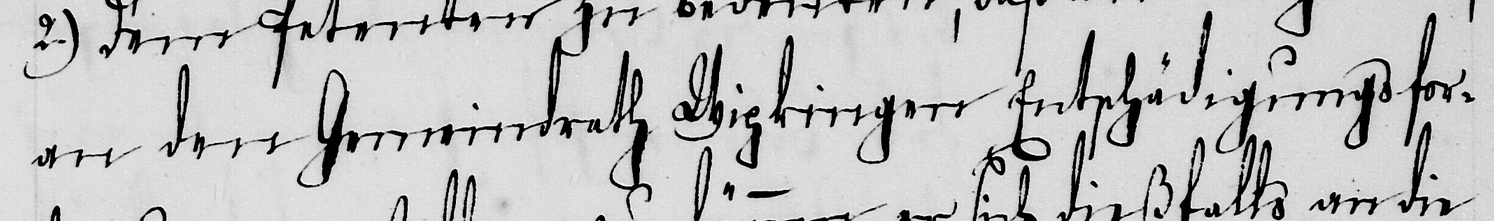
an den Gemeindrath Wipkingen Entschädigungsfor¬
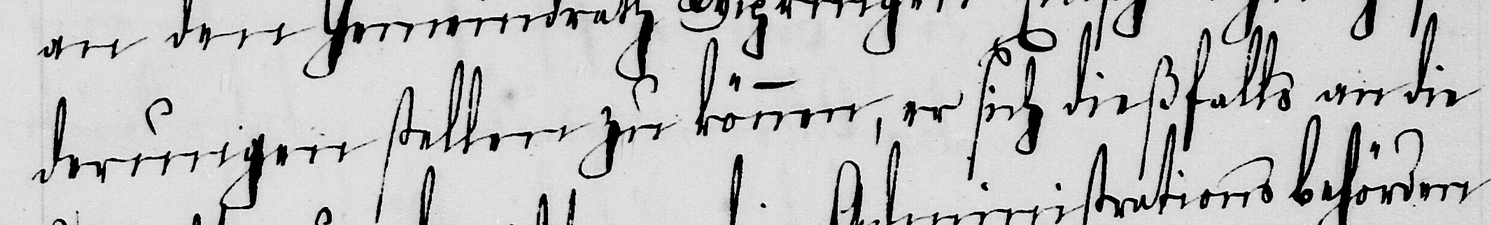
derungen stellen zu können, er sich dießfalls an die
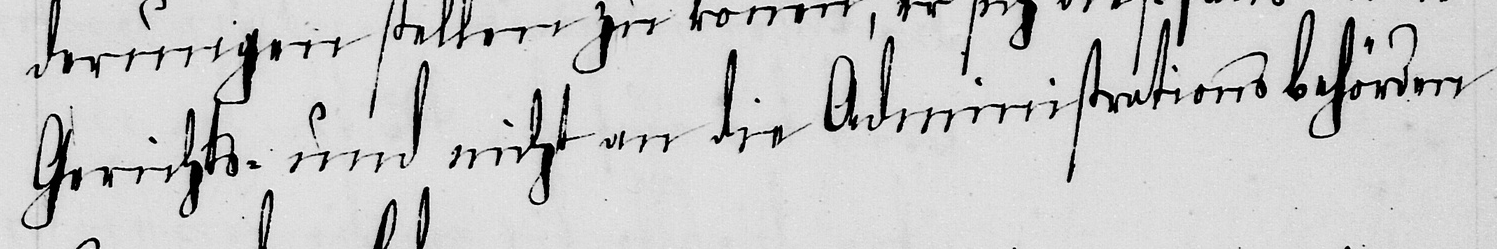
Gerichts- und nicht an die Administrationsbehörden
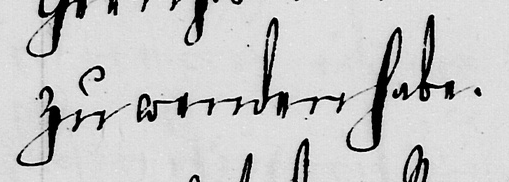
zu wenden habe.
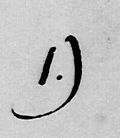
1.)
